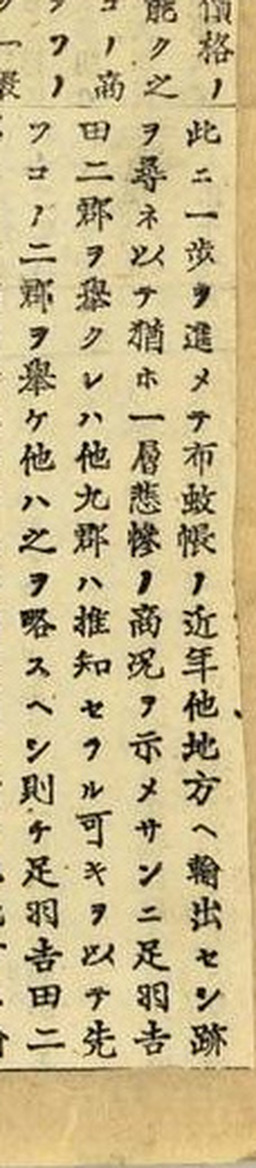ヲ尋ネ以テ猶ホ一層悲惨ノ商况ヲ示メサンニ足羽吉
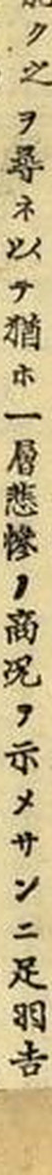ヲ尋ネ以テ猶ホ一層悲惨ノ商况ヲ示メサンニ足羽吉
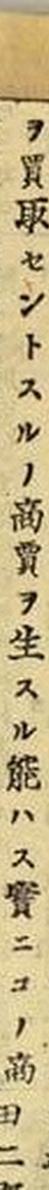ヲ買取セントスルノ商賣ヲ生スル能ハス實ニコノ商
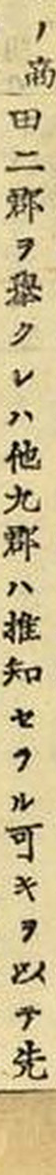田二郡ヲ舉クレハ他九郡ハ推知セラル可キヲ以テ先
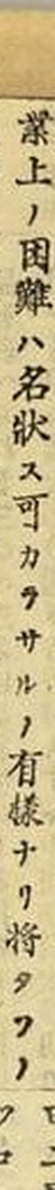業上ノ困難ハ名狀ス可カラサルノ有様ナリ将タソノ
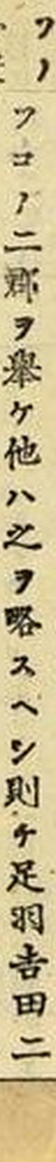ツコノ二郡ヲ擧ケ他ハ之ヲ略スヘシ則チ足羽吉田二
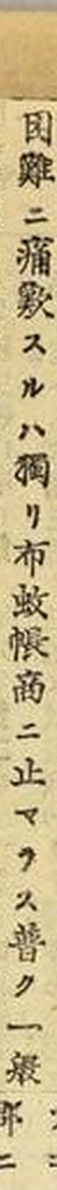困難ニ痛歎スルハ獨リ布蚊帳商ニ止マラス普ク一般
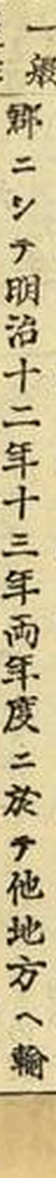郡ニシテ明治十二年十三年両年度ニ於テ他地方ヘ輸
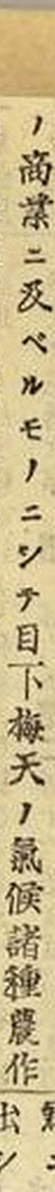ノ商業ニ及べルモノニシテ目下梅天ノ氣候諸種農作
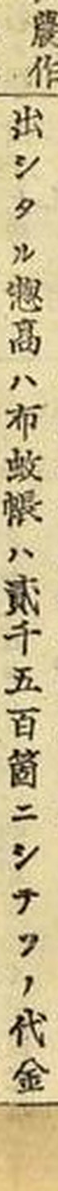出シタル惣髙ハ布蚊帳ハ貮千五百箇ニシテソノ代金
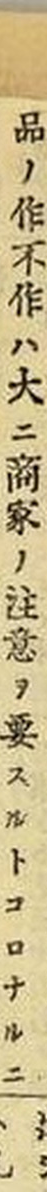品ノ作不作ハ大ニ商家ノ注意ヲ要スルトコロナルニ
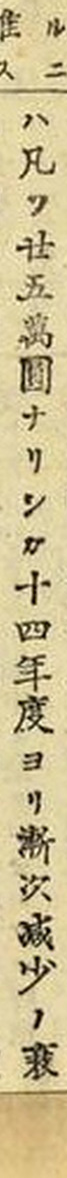ハ凡ソ廿五萬圓ナリシガ十四年度ヨリ漸次減少ノ衰
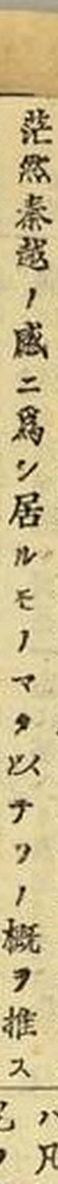茫然秦越ノ感ニ爲シ居ルモノマタ以テソノ概ヲ推ス
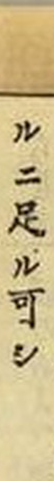ルニ足ル可シ
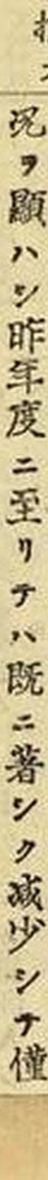况ヲ顯ハシ昨年度ニ至リテハ既ニ著シク減少シテ僅
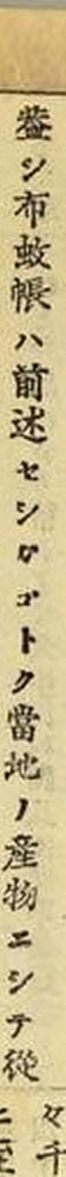葢シ布蚊帳ハ前述セシガゴトク當地ノ産物ニシテ從
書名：温古集 五巻
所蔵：福井県文書館 Fukui Prefectural Archives
